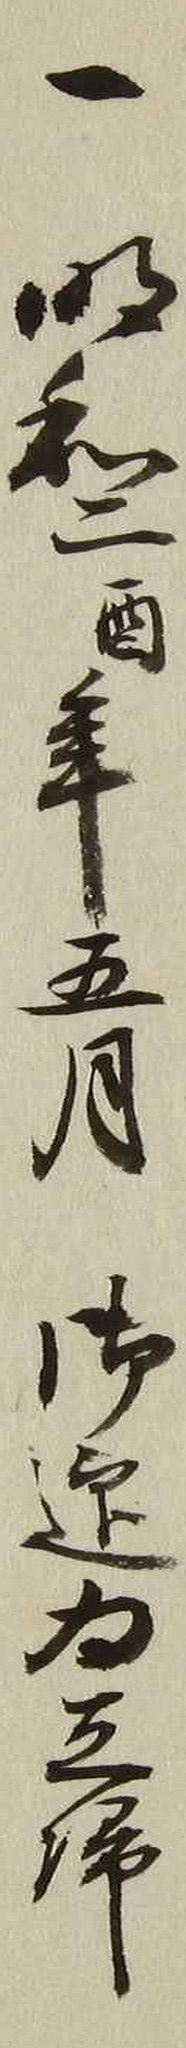一明和二酉年五月御迎為立帰
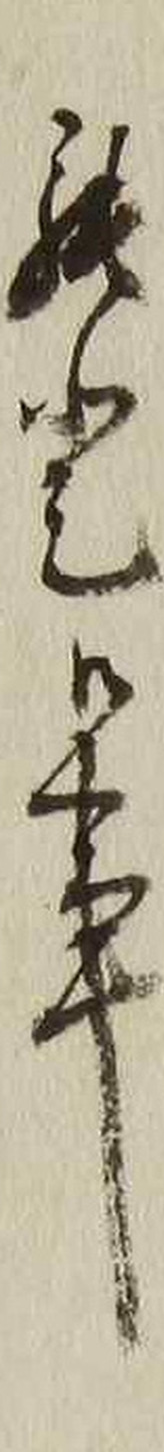罷登候事
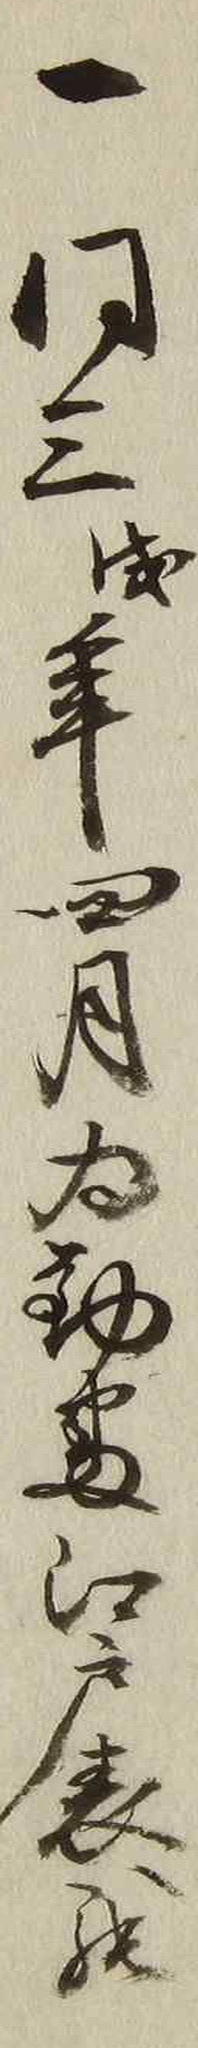一同三戌年四月為勤番江戸表へ罷
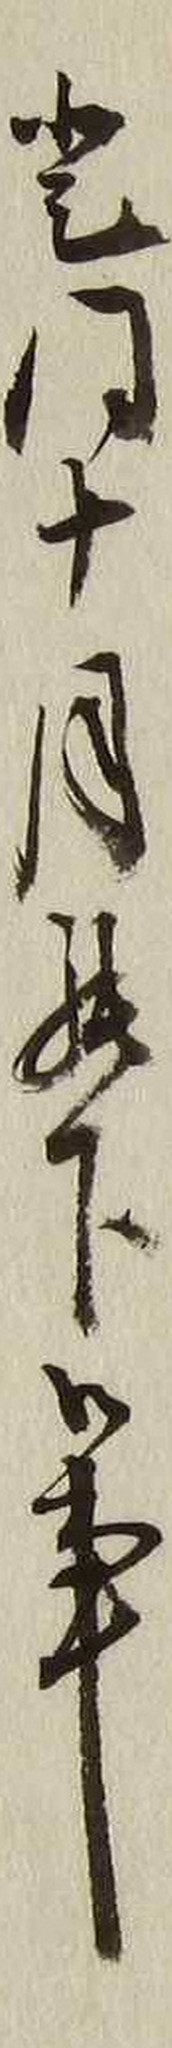登同十月罷下候事
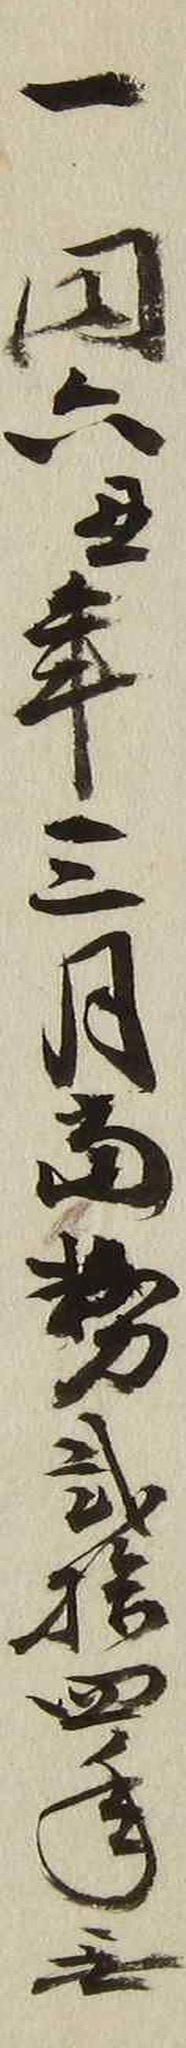一同六丑年三月当務弐拾四年無
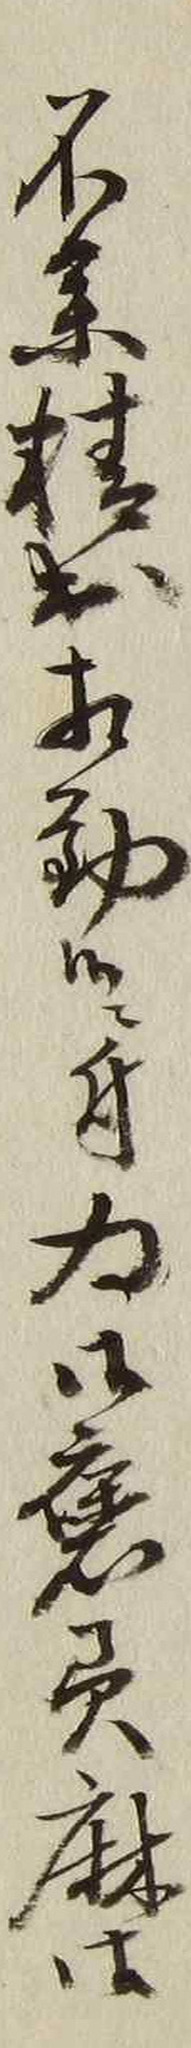不参精出相勤候ニ付為御褒美麻御
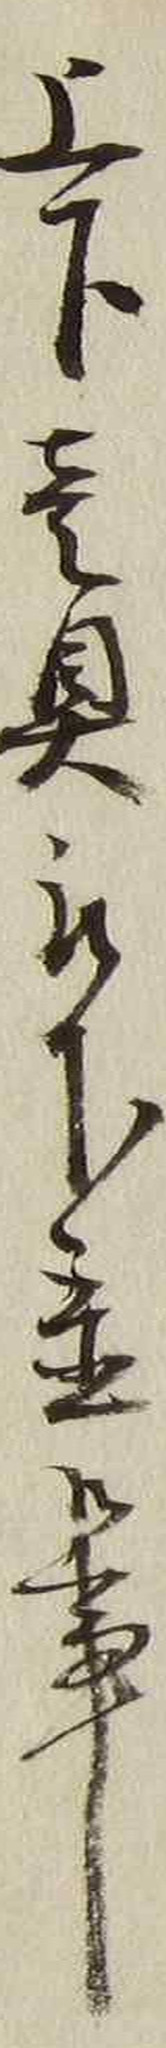上下壱具被下置候事
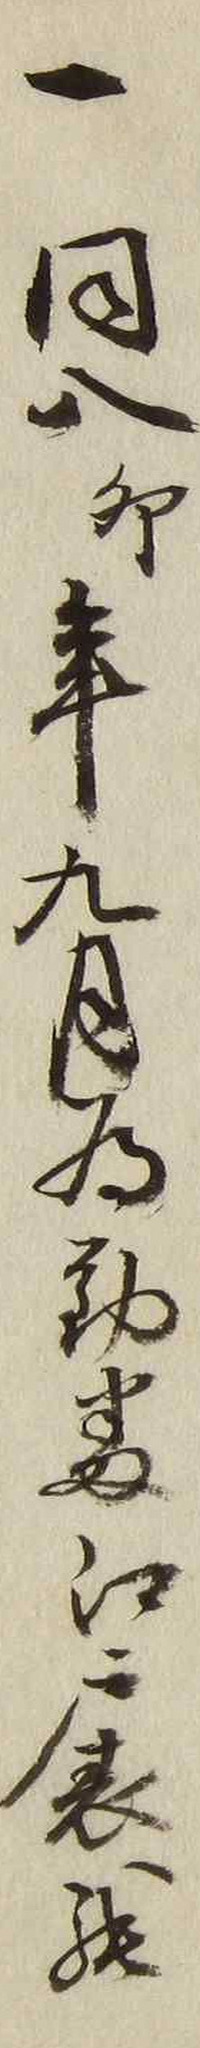一同八卯年九月為勤番江戸表へ罷

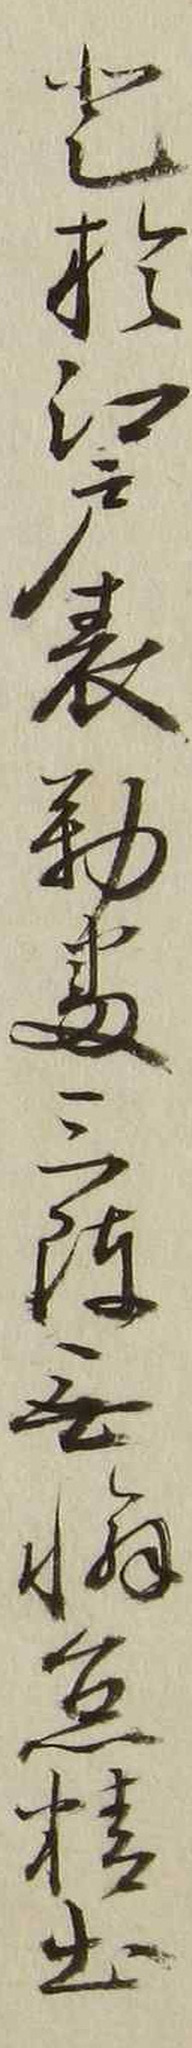登於江戸表勤番三陣無懈怠精出
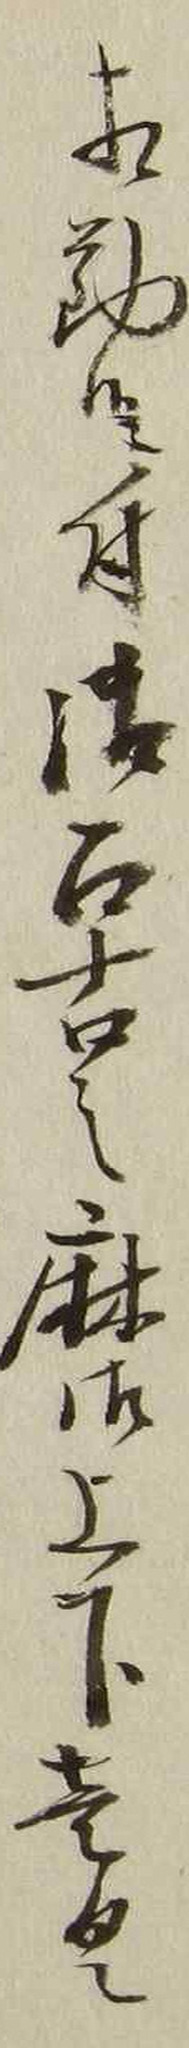相勤候ニ付御召古之麻御上下壱具
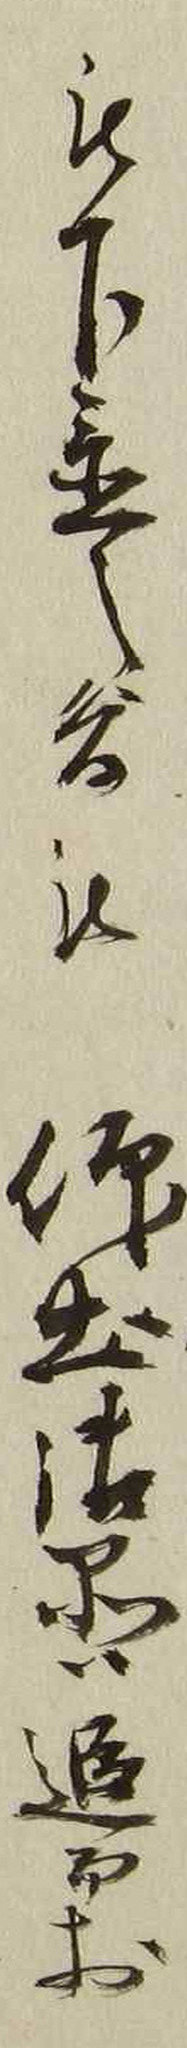被下置之旨被仰出御品ハ追而於
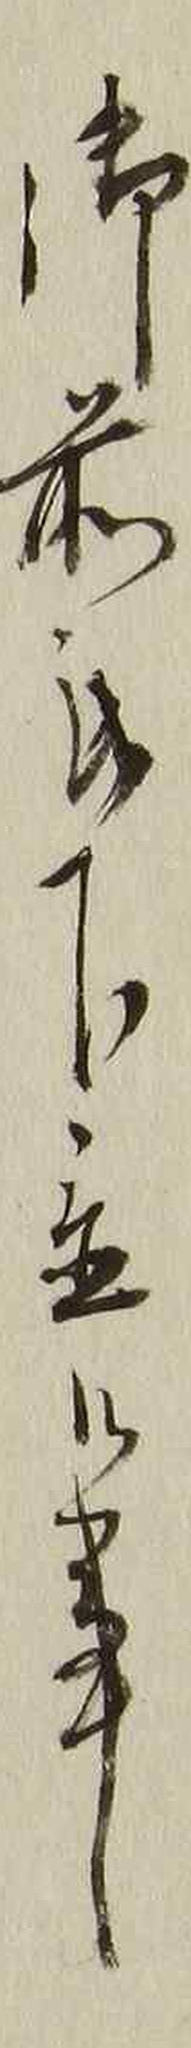御前被下置候事
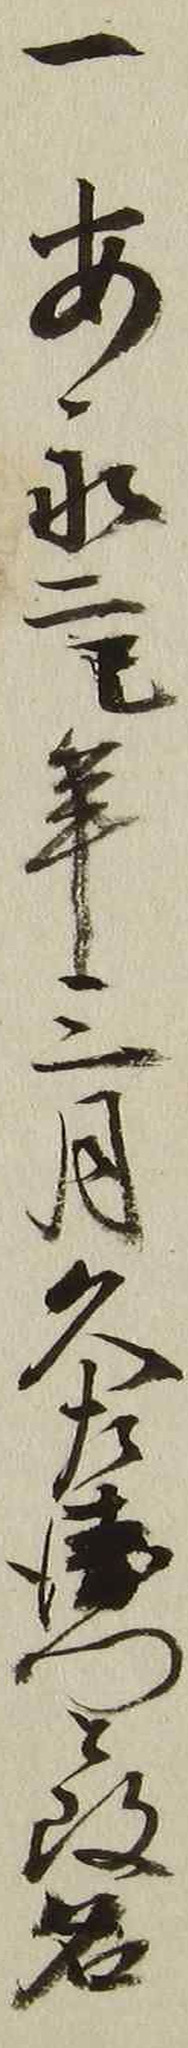一安永二巳年三月久左衛門と改名
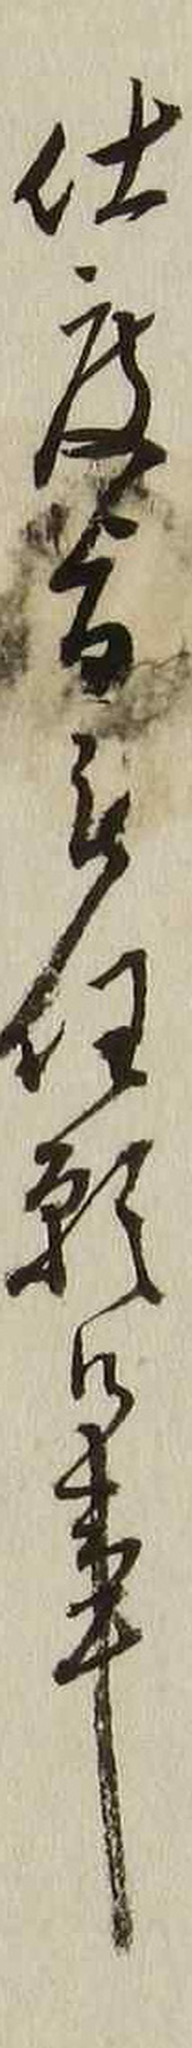仕度旨被任願候事
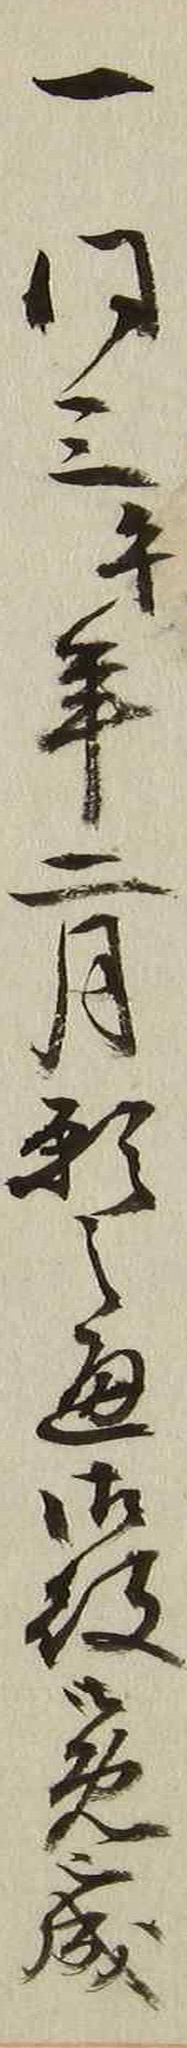一同三午年二月願之通御役御免被成
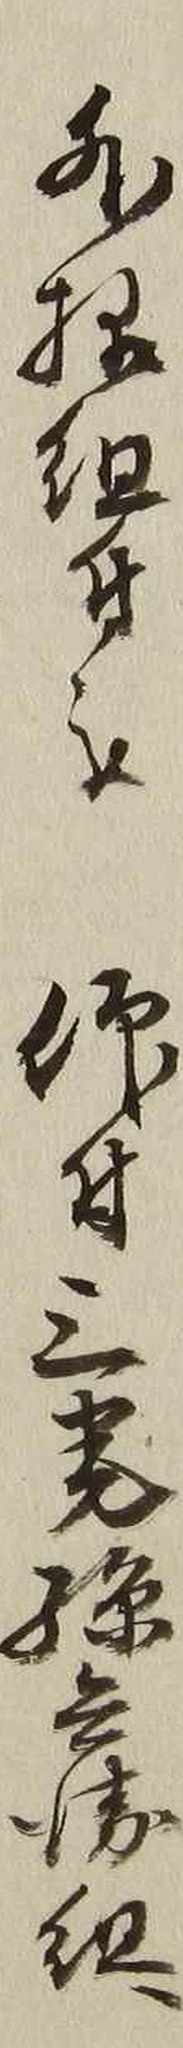外様組付被仰付三宅孫兵衛組へ
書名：諸士系譜　巻之23　い之部23
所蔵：会津若松市立会津図書館
